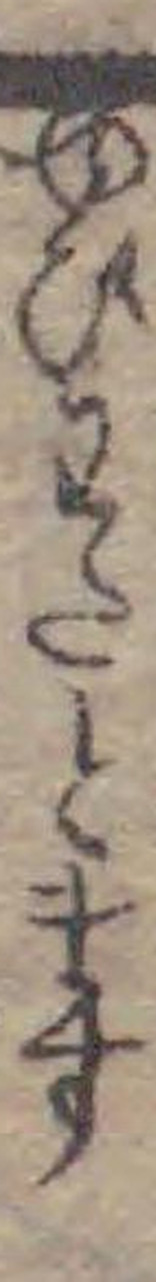ゆひわたとます
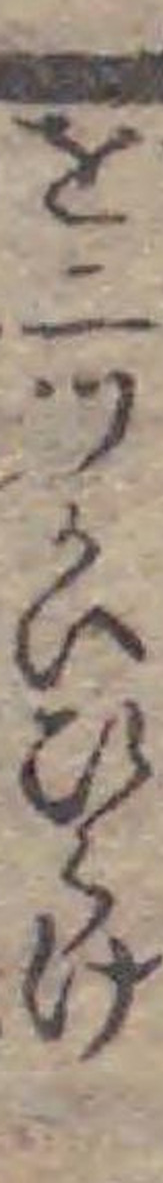を二つかいひらけ
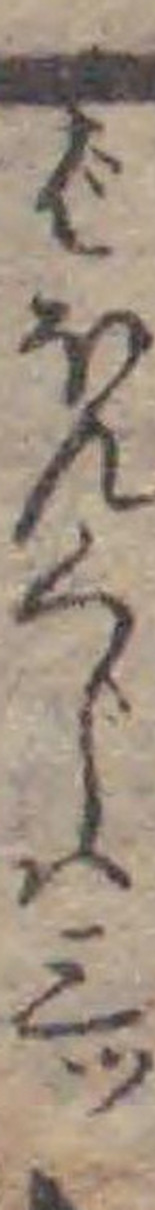ばほんくじは三つ
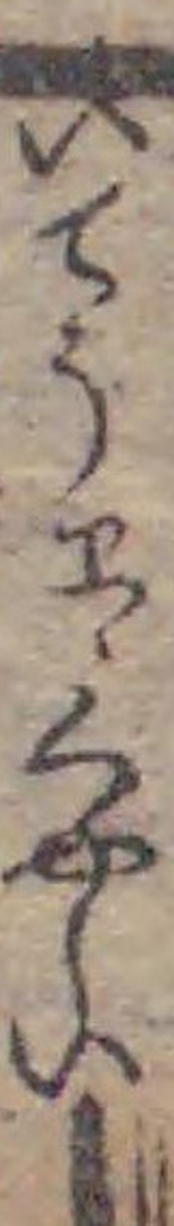いてうヱヽくやしい
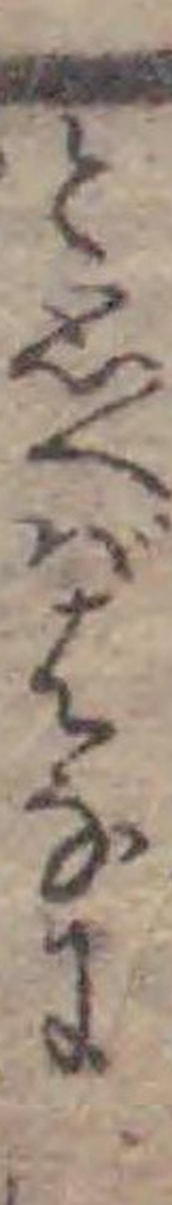と思へばはなに
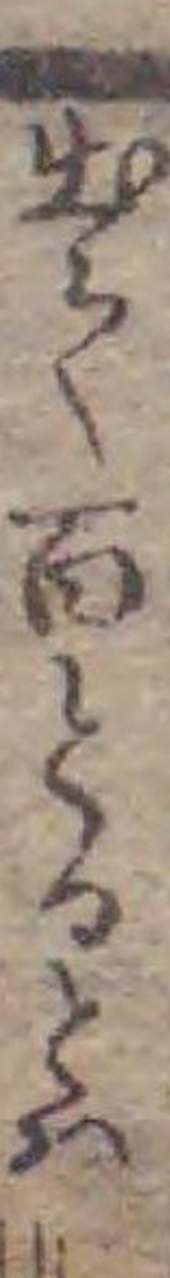出て百とるとは
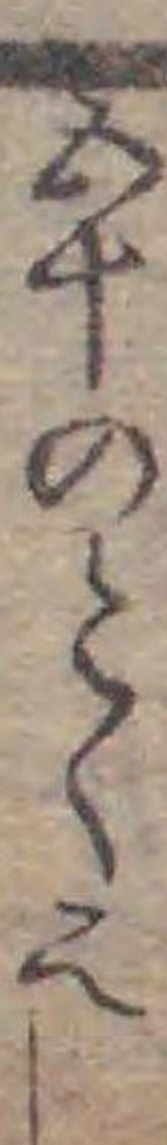五十のとく也
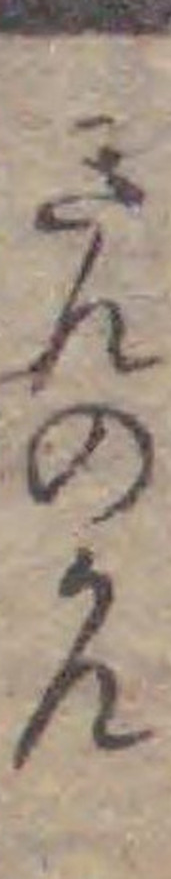きんのかん
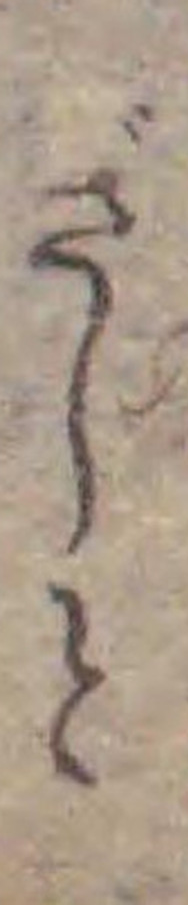ざしと
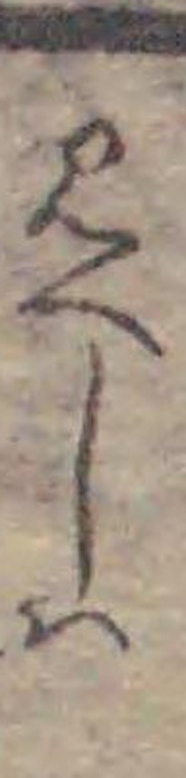見へしは
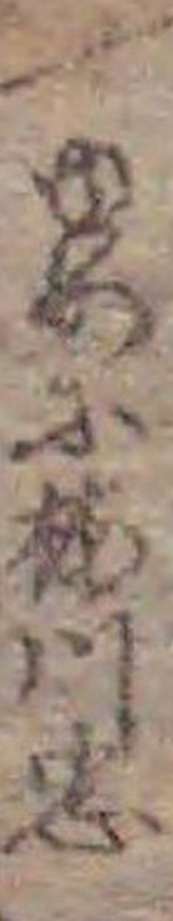ゆめに梅川忠
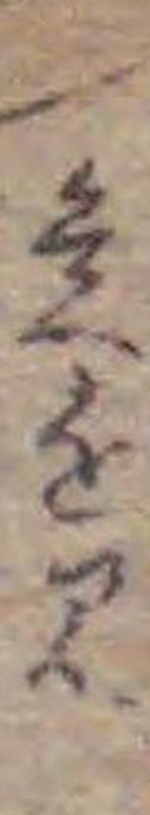兵へを見
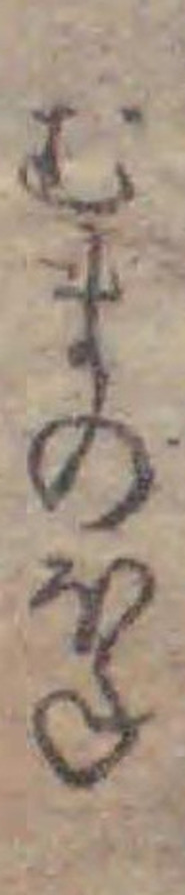むまのほね

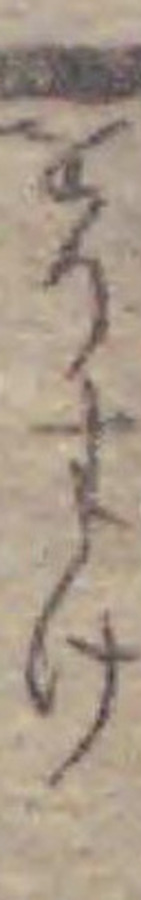をりすけ
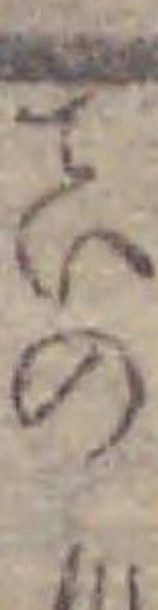ていの
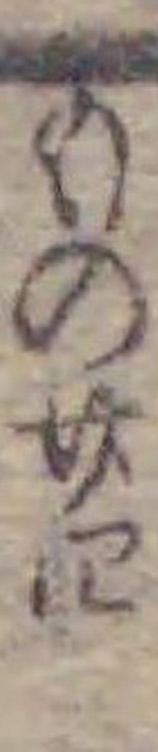もの廿四
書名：紺屋百物語 : 3巻
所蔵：国立国会図書館 National Diet Library, JAPAN
